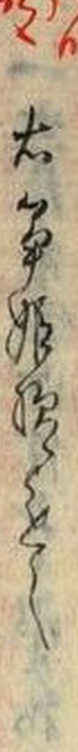右箏姫様へ被進之
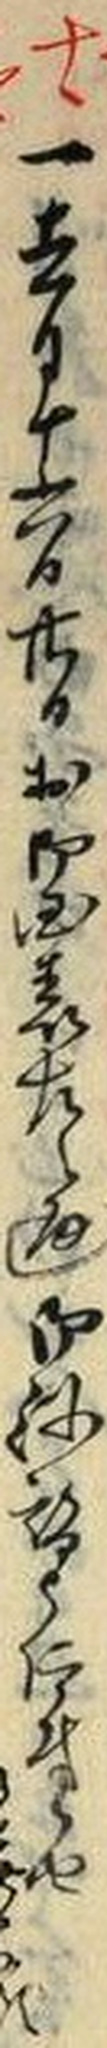一去月十六日廿日於御国表左之通御役替被仰付候由
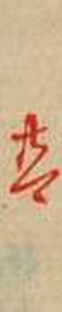廿八日
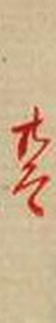廿八日
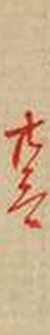廿八日
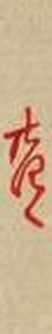廿八日
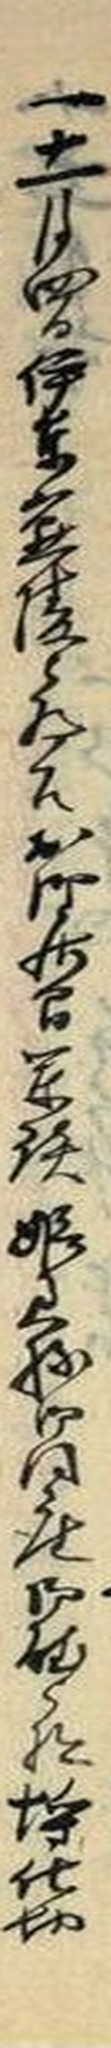一十一月四日伊東燕陵被為召於御居間軍談姫君様御同座御聴被遊埒仕切
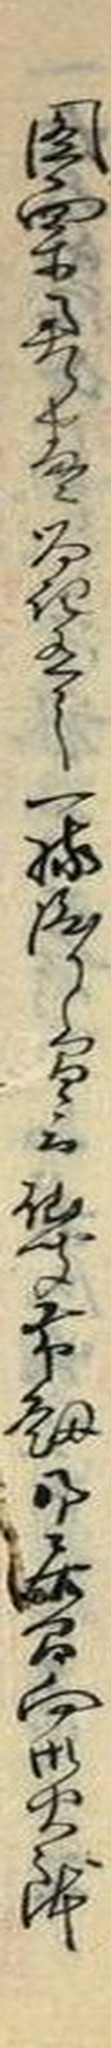図面等奥之番ニ留記有之一統渡り之間ニ而聴聞帯釼御居間向御火鉢
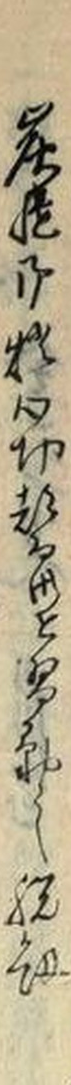炭継御燈心切替御近習勤之祝釼
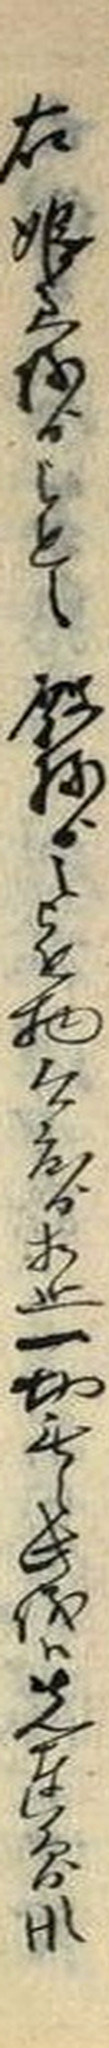右姫君様ゟ被進之殿様ゟ之被進物今度ゟ相止一切無之此儀ハ先達而ゟ御
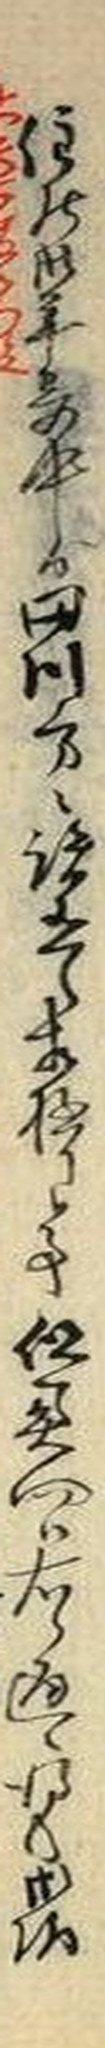住居御年寄中ゟ田川方へ話有之相極り候事但奥向ハ右之通候得共御附
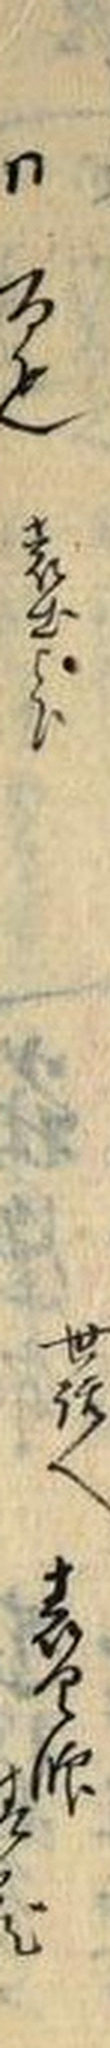同百疋表出被下世話人表具師清蔵

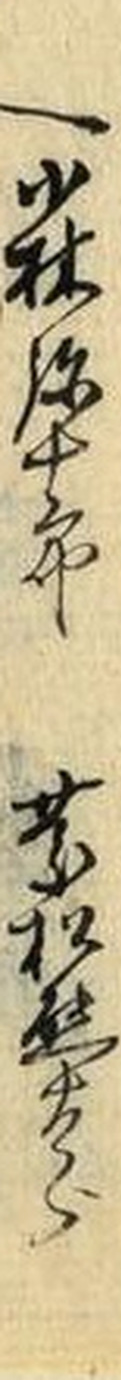小林孫十郎慶松熊太郎
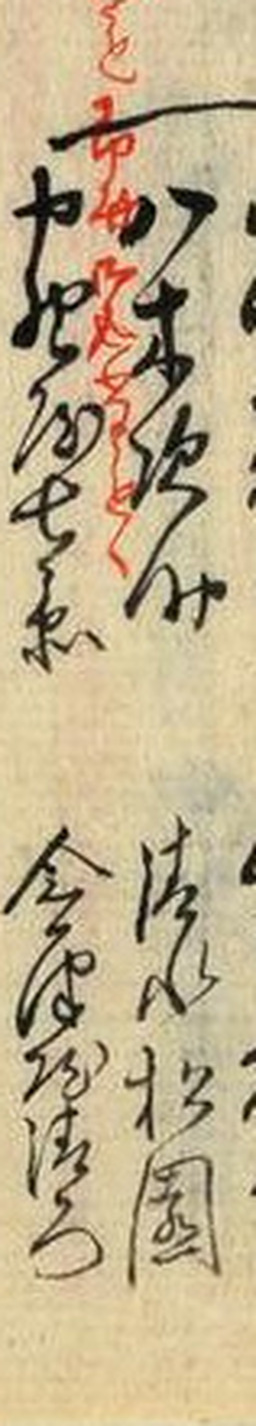中野屋七兵衛会津屋清右衛門
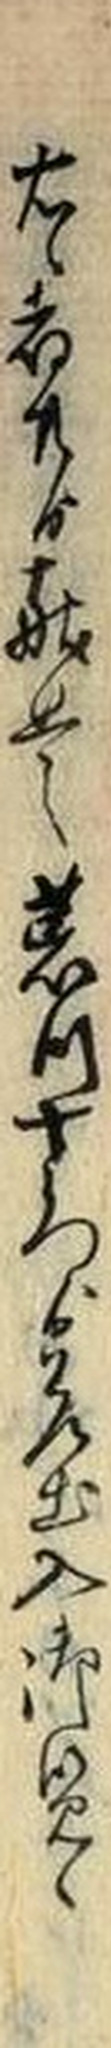右之者共ゟ献上之荒川十右衛門ゟ差出入御覧候
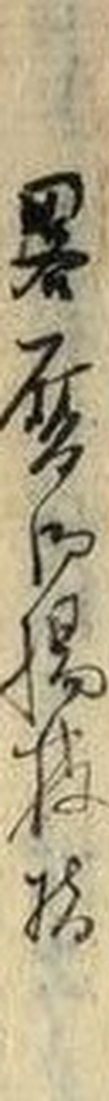略歴御楊枝指
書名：少傅日録抄（斉承付側向頭取日記、在府）
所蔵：福井県文書館 Fukui Prefectural Archives
